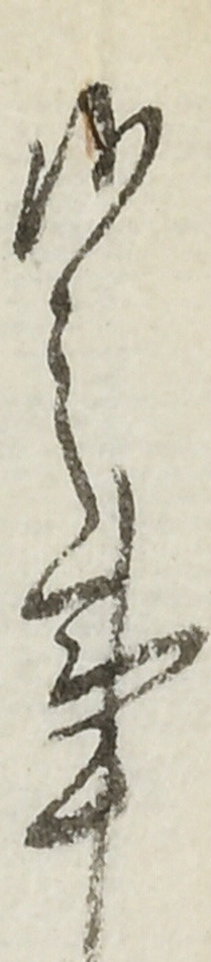候之事
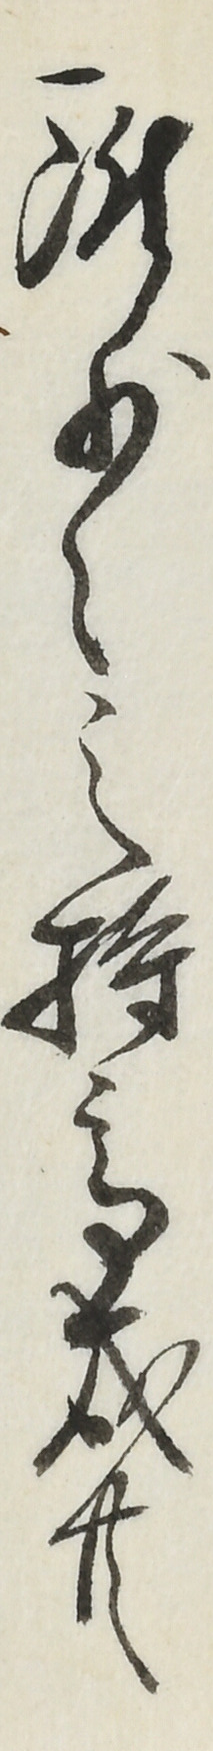附少々之持高成共
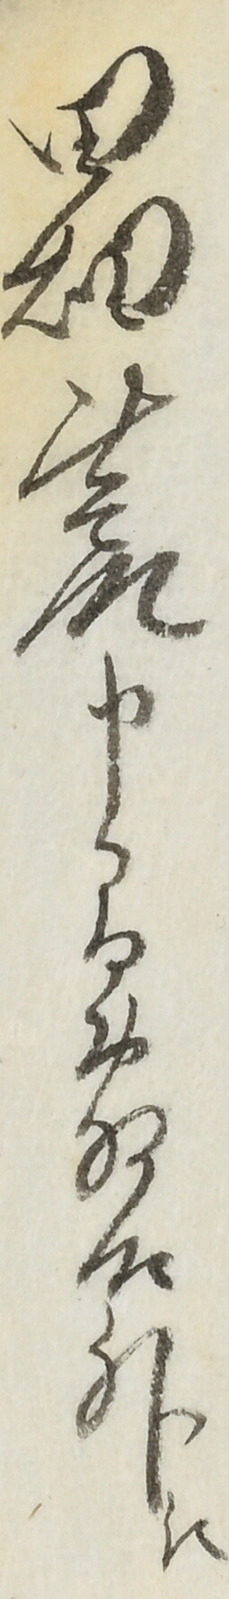田畑荒申間敷候外え

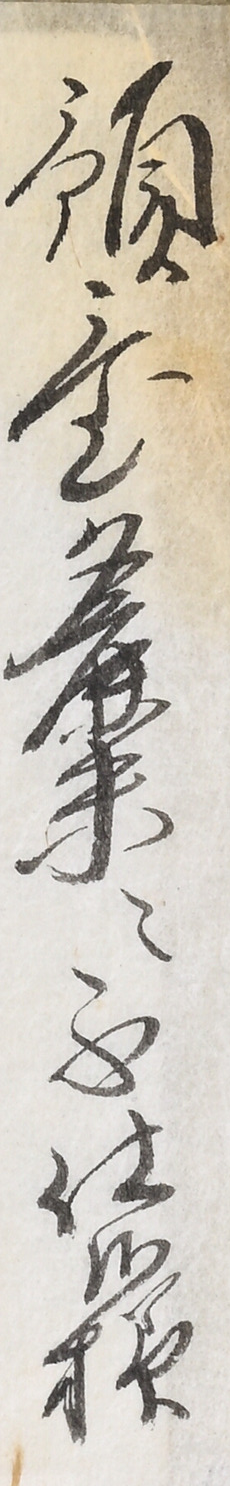預置麤末ニ不仕候様
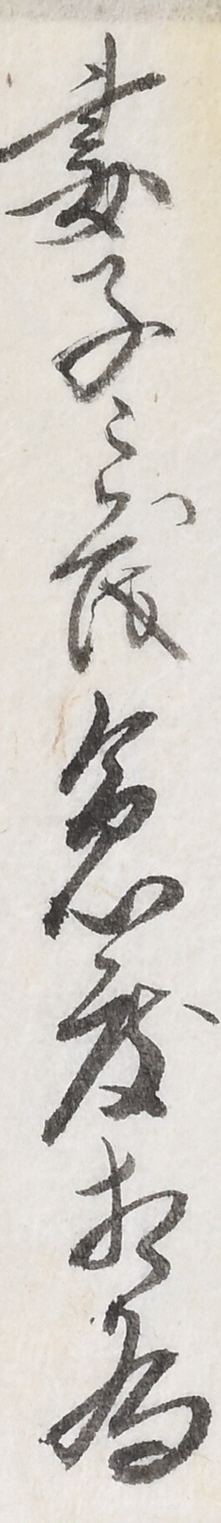妻子ニも急度相為
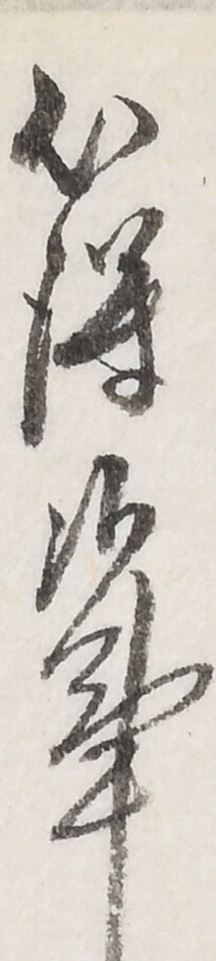心得候事
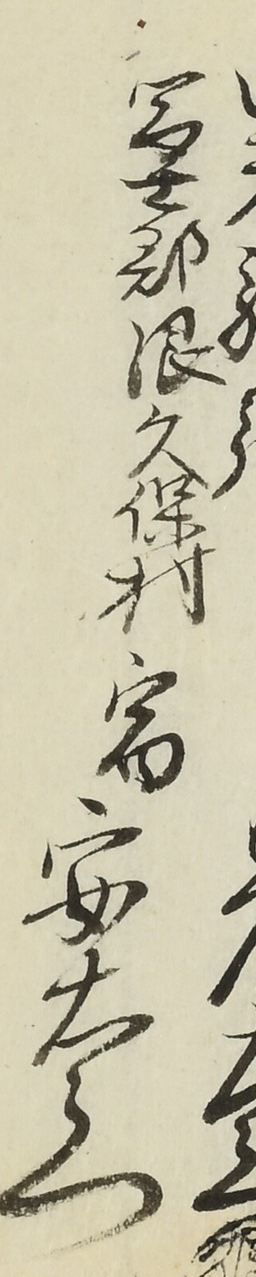富士郡銀久保村宿安右衛門

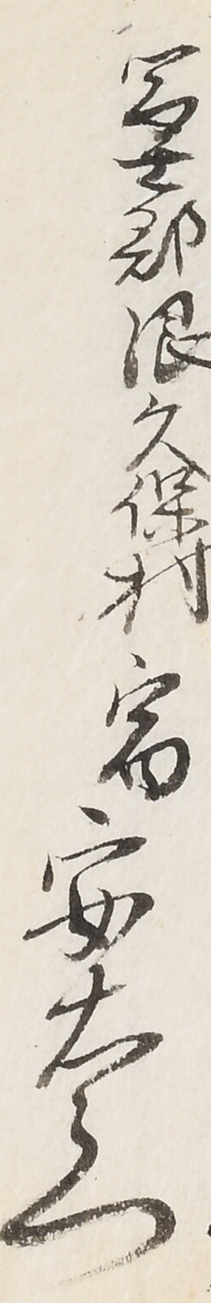富士郡銀久保村宿安右衛門
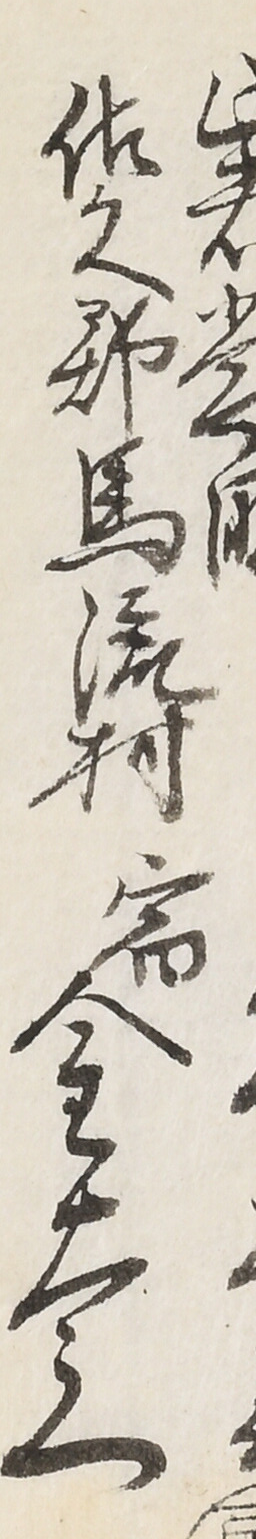佐久郡馬流村宿金右衛門
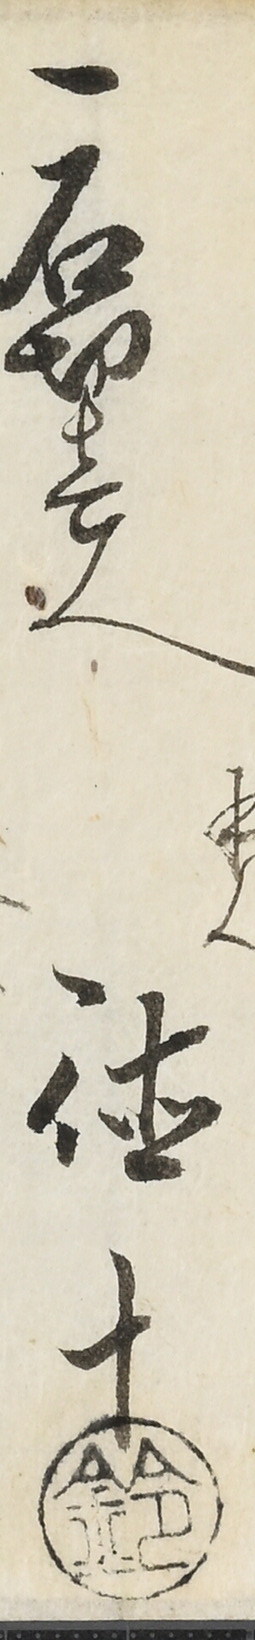一石切壱人本人徳十印
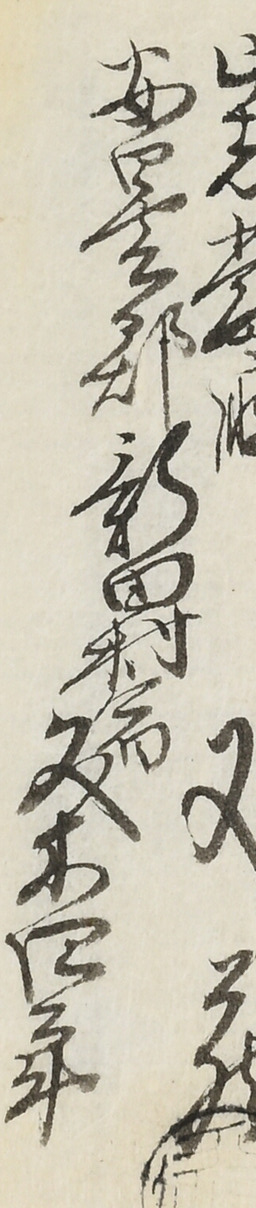安曇郡新田村宿粂四郎

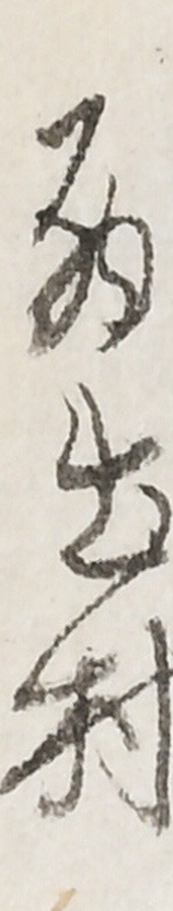西出村
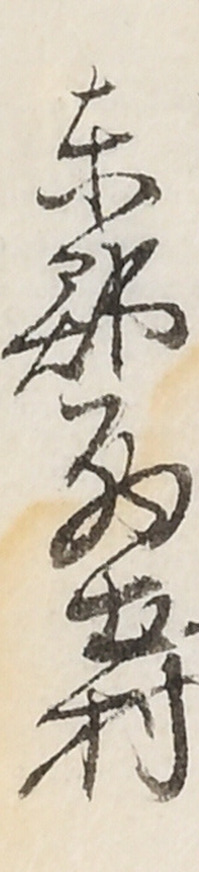東郡西出村
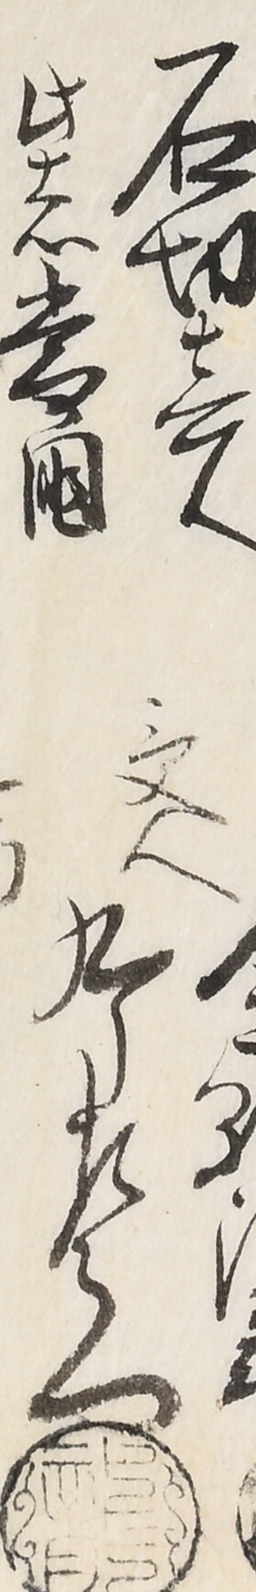此者当国受人九郎左衛門印
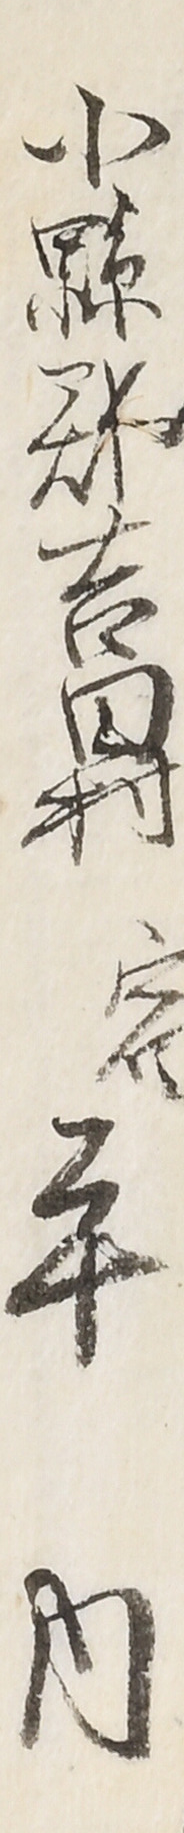小県群吉田村宿平内
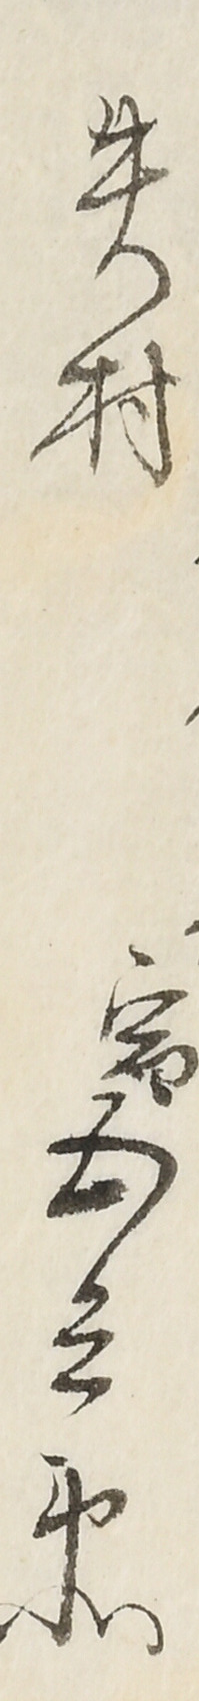失村宿五兵衛
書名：文久二壬戌年正月石切名前書上帳
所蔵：伊那市立高遠町図書館・合同会社AMANE
